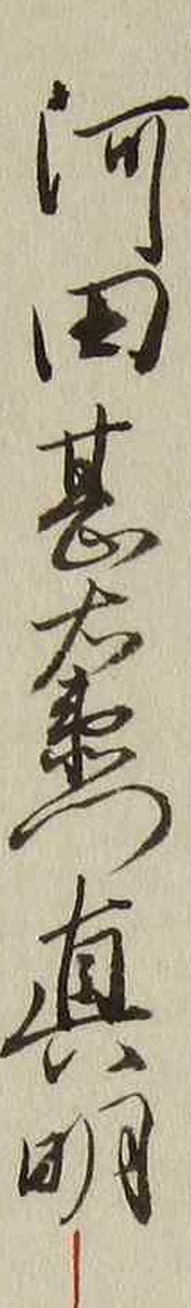河田甚右衛門真明
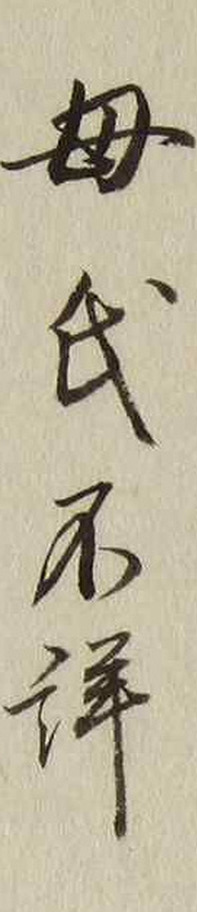母氏不詳
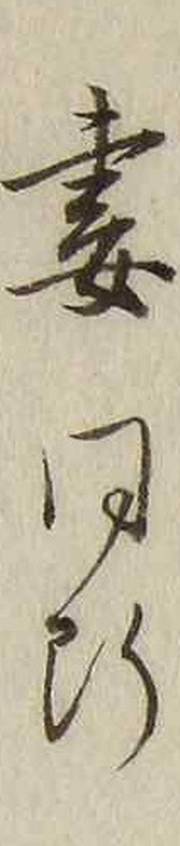妻同断

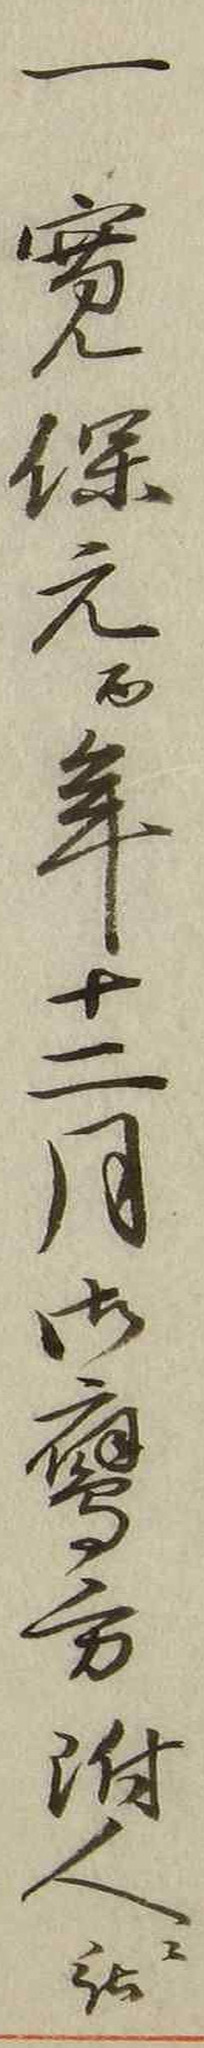一寛保元酉年十二月御鷹方附人ニ被
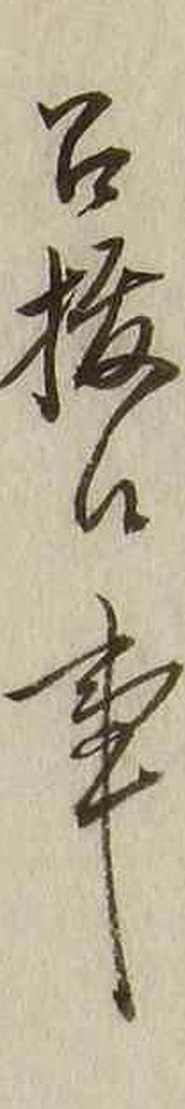召抜候事
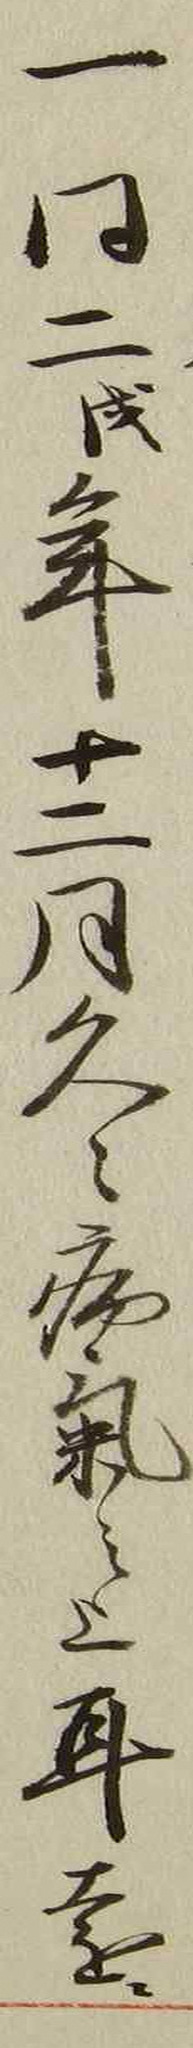一同二戌年十二月久々病気之上耳遠ニ
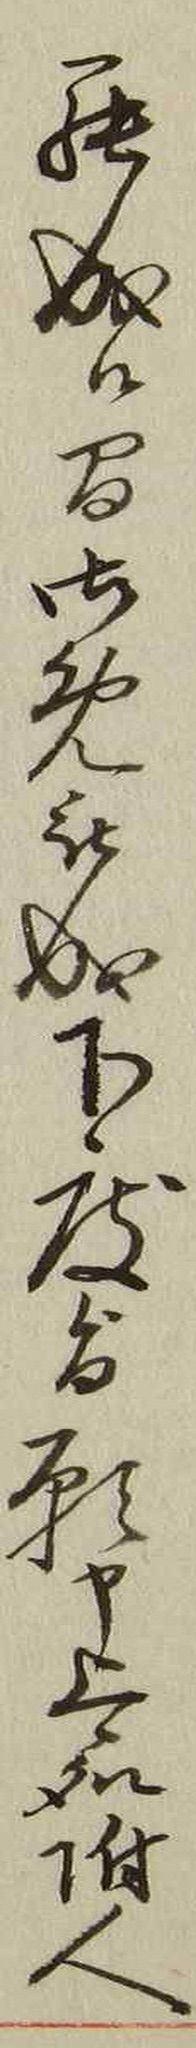罷成候間御免被成下度旨願申上候処附人
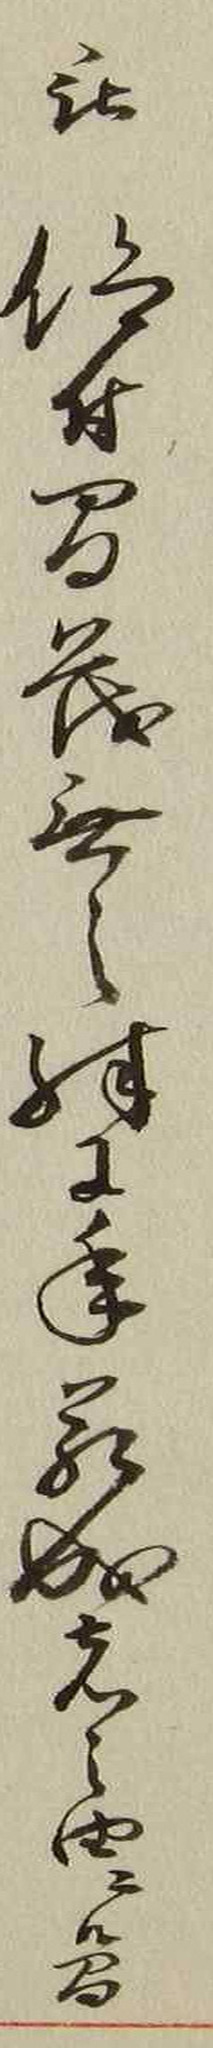被仰付間も無之殊に年若成者之由ニ候間
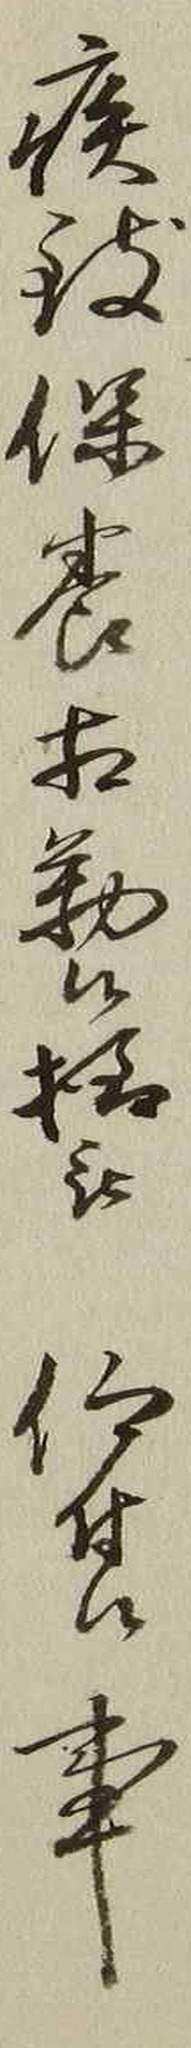疾致保養相勤候様被仰付候事
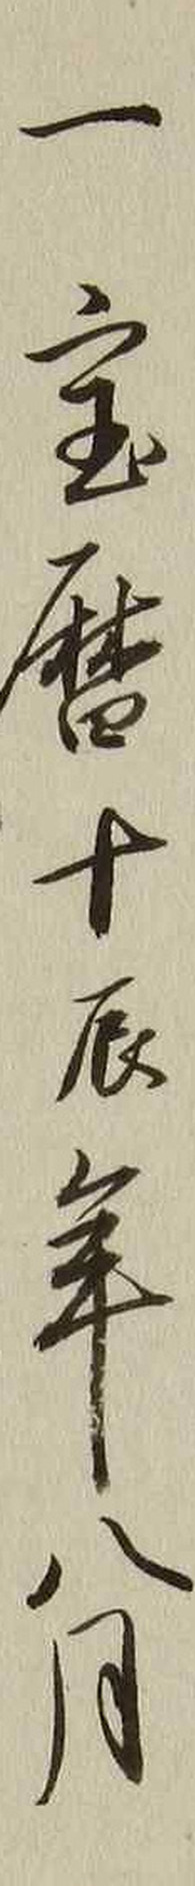一宝暦十辰年八月
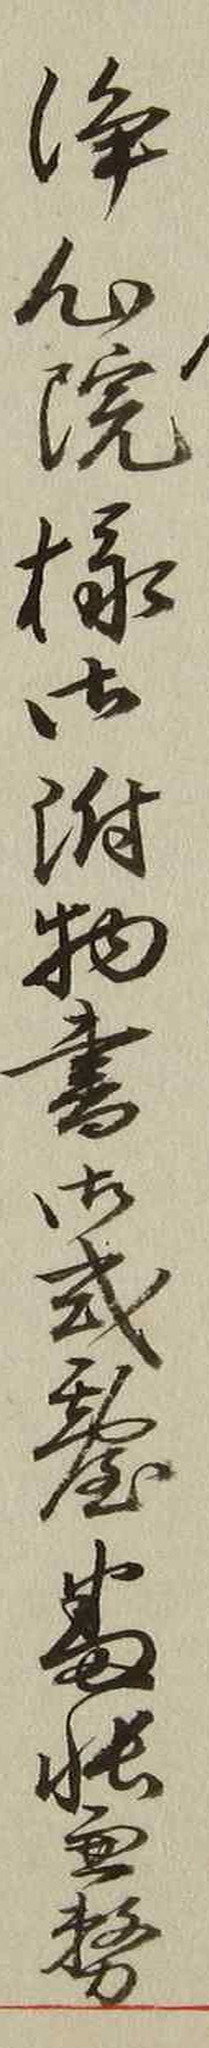浄心院様御附物書御式台番帳兼務
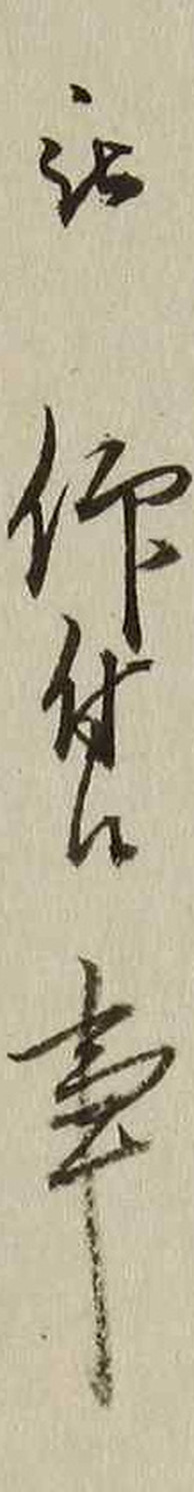被仰付候事
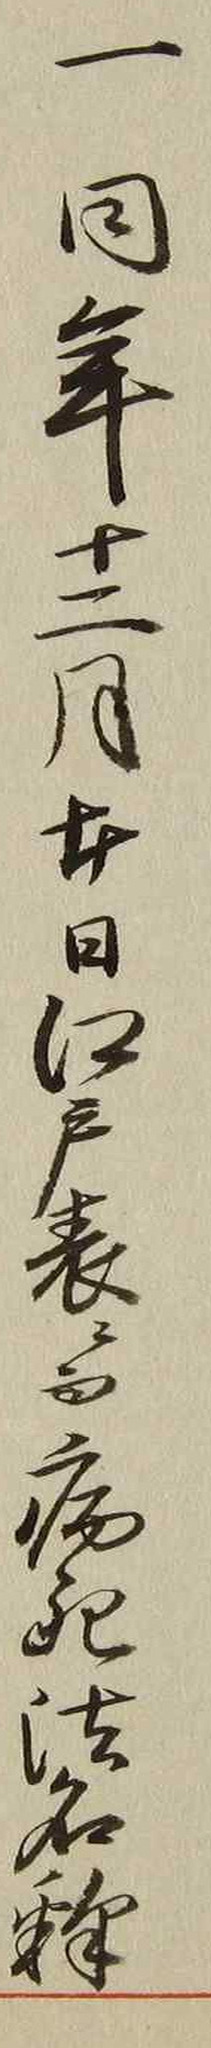一同年十二月廿日江戸表ニ而病死法名釈
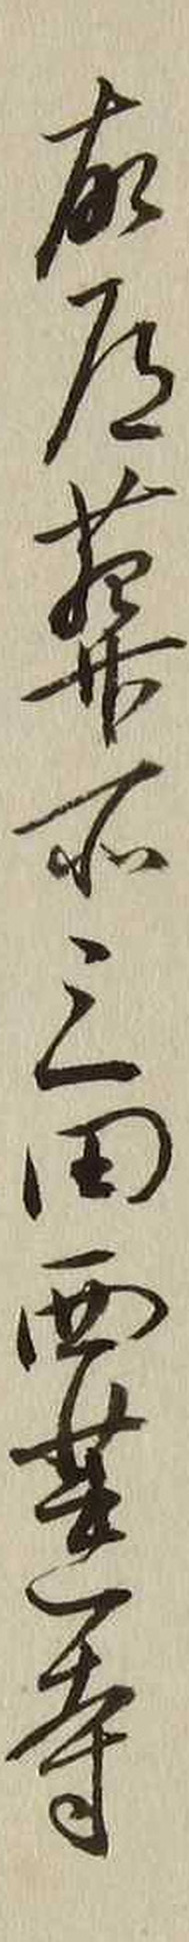故道葬所三田西蓮寺
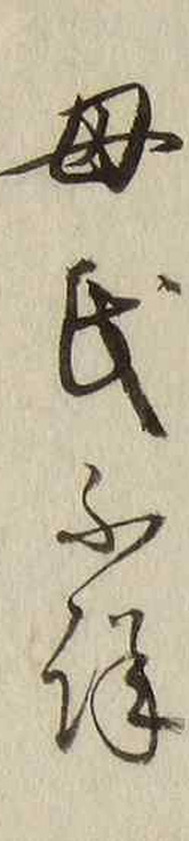母氏不詳
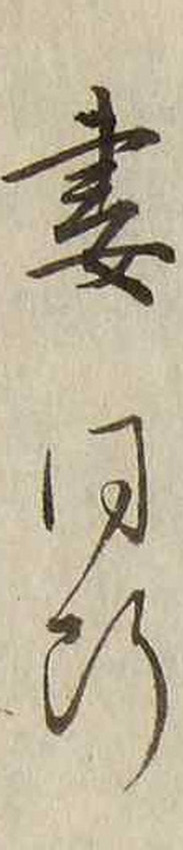妻同断
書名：諸士系譜　巻之102　か之部10
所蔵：会津若松市立会津図書館
